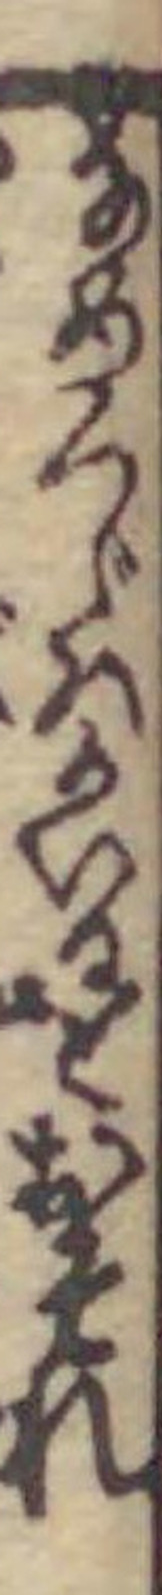なめくじはかいるをおそれ
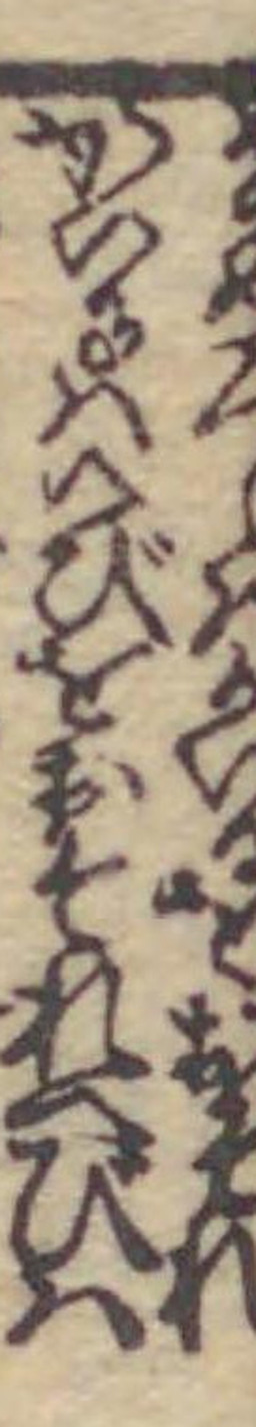かいるはへびをおそれへびは
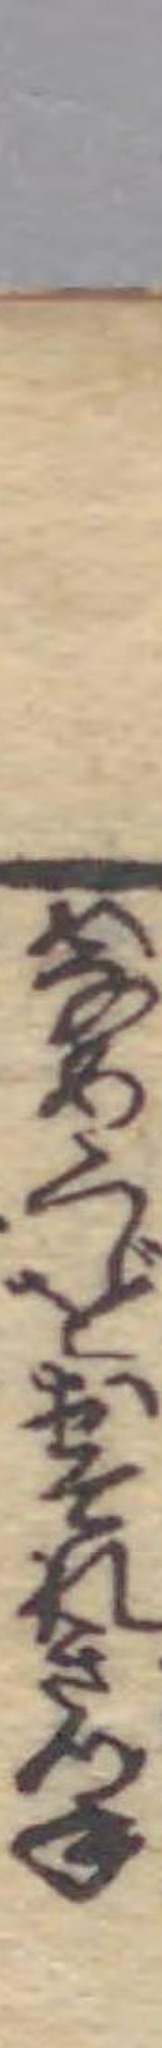はなめくじをおそれきつね
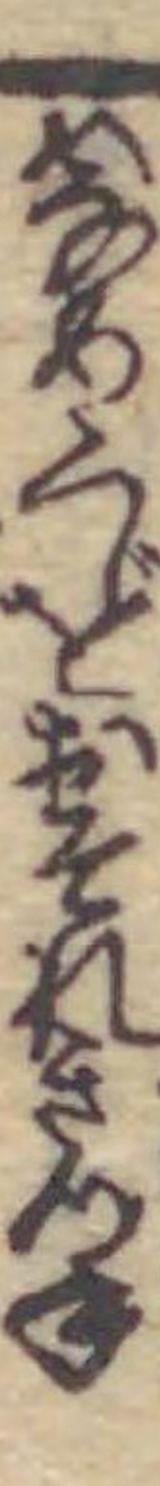はなめくじをおそれきつね
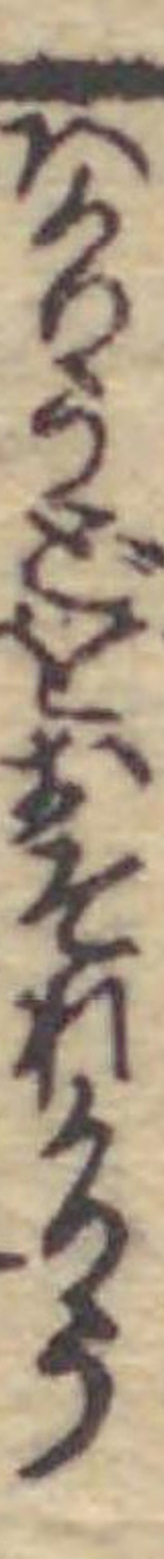はかりうどをおそれかりう
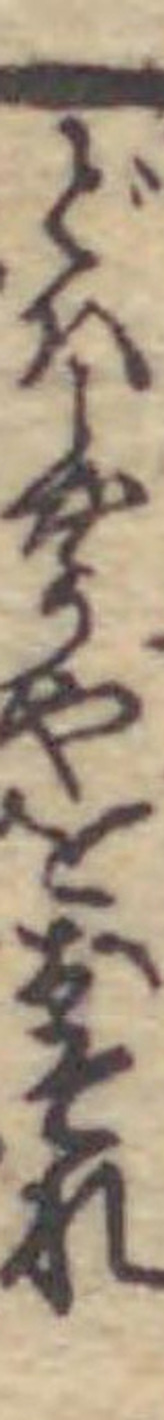どはしやうやをおそれ
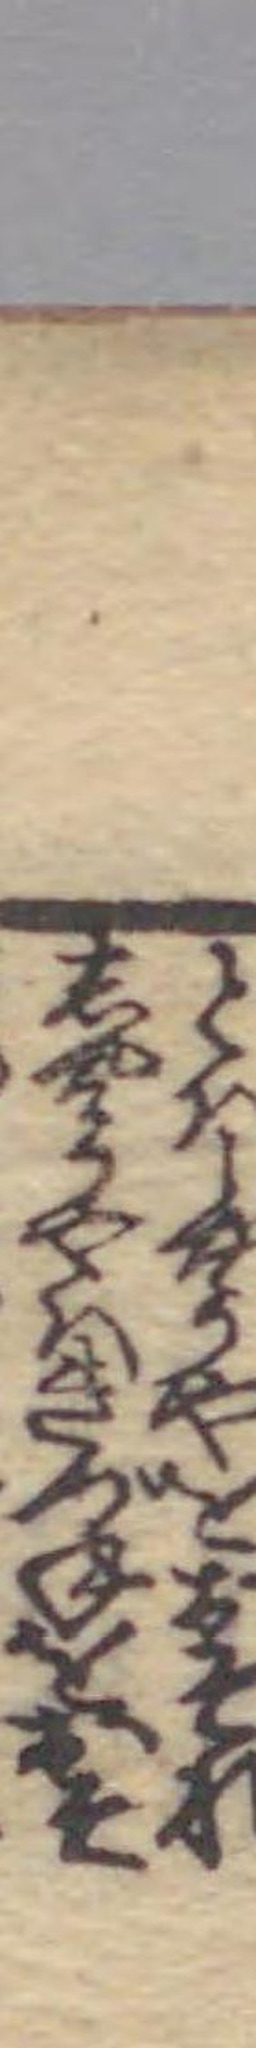しやうやはきつねをおそ
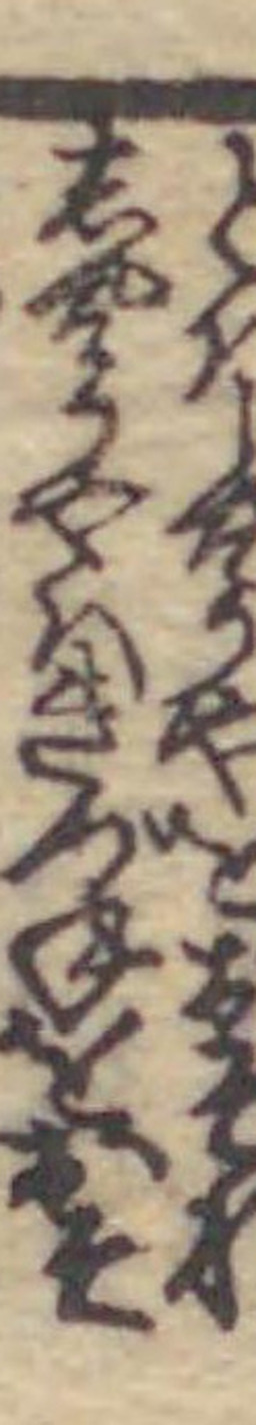しやうやはきつねをおそ
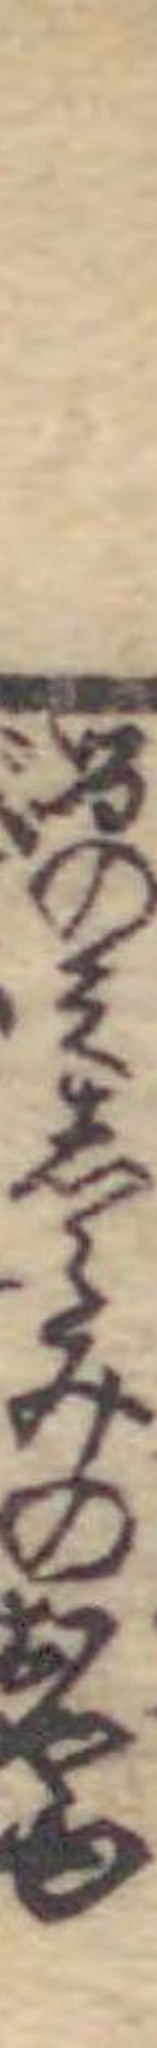るのみしらみのおやゆ
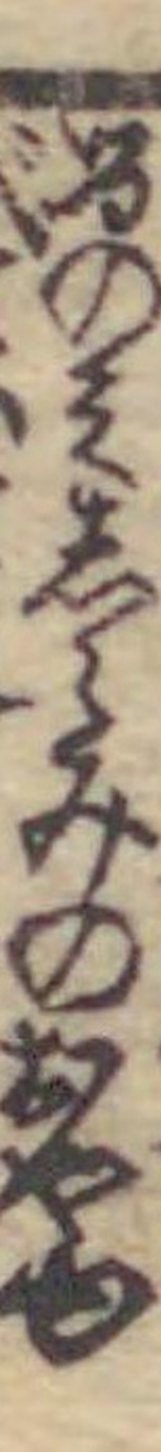るのみしらみのおやゆ
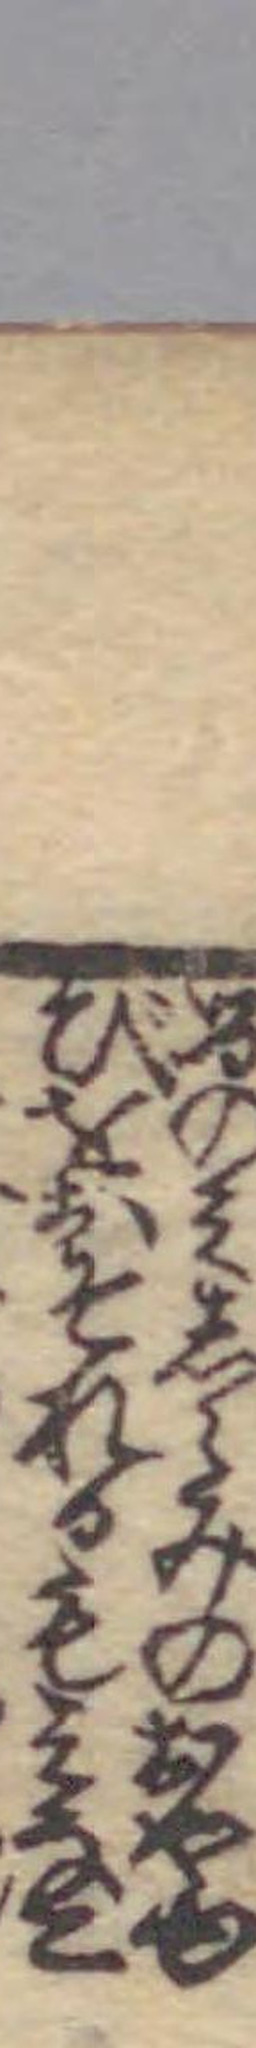びをおそれるもみなこ
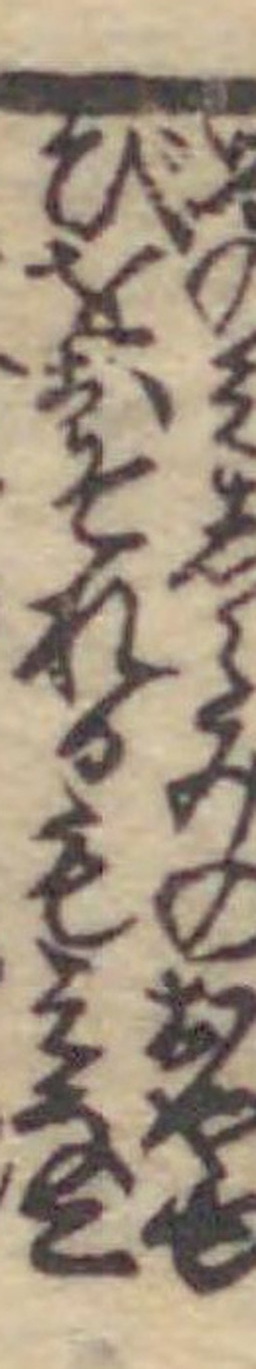びをおそれるもみなこ
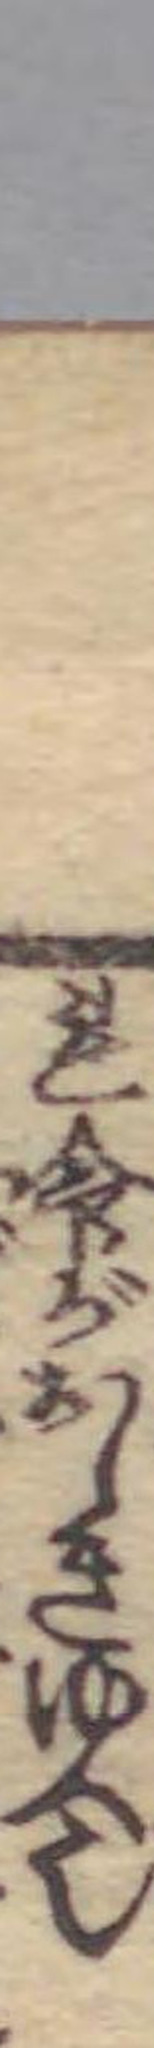れ命がおしきゆへ也
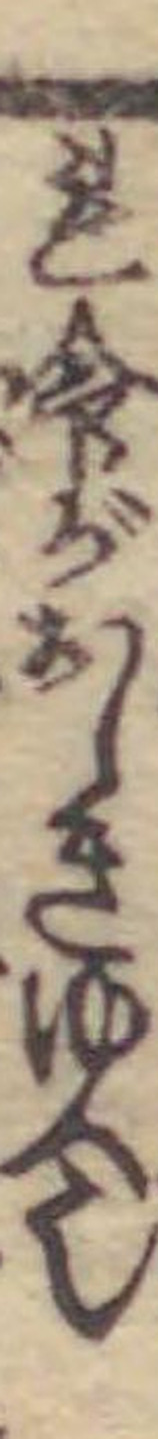れ命がおしきゆへ也
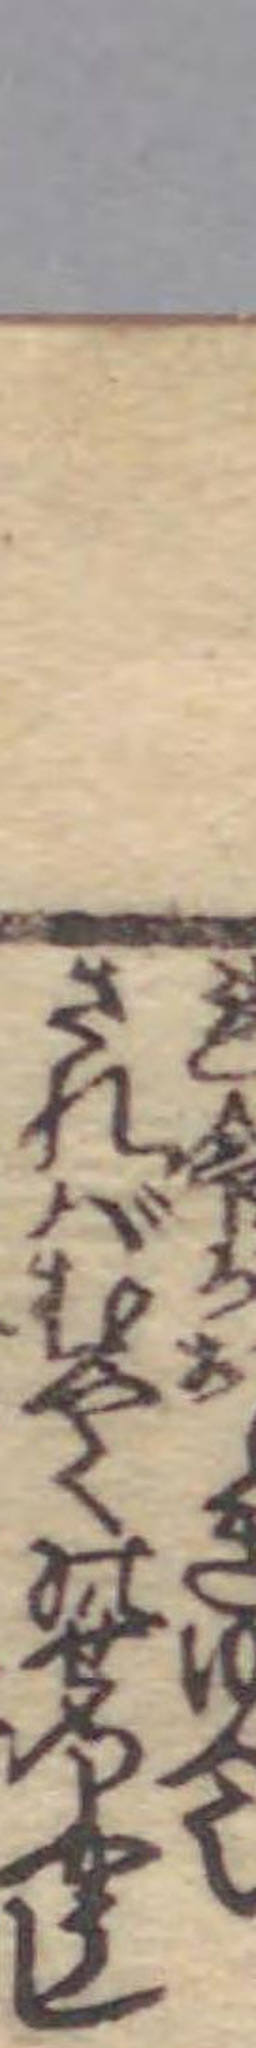さればむやくのせつしやうし
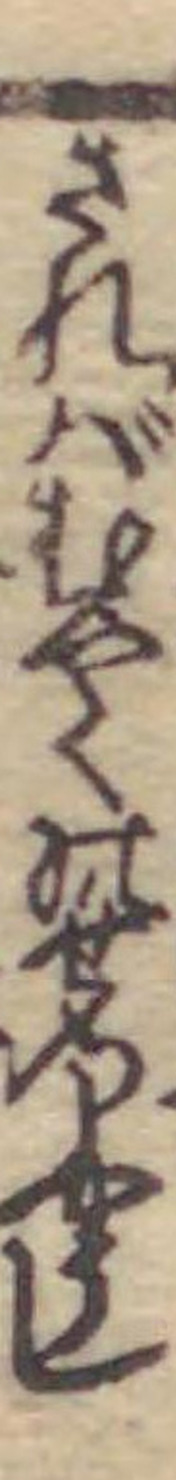さればむやくのせつしやうし
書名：御誂染長寿小紋 : 3巻
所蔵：国立国会図書館 National Diet Library, JAPAN
